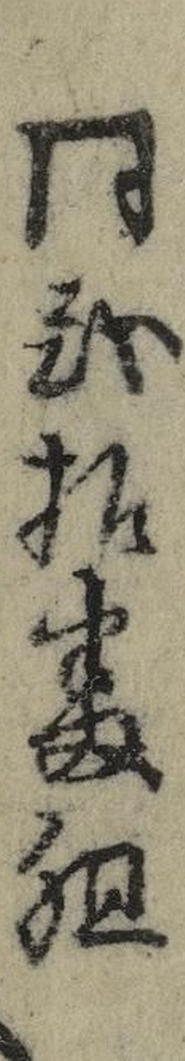同弐拾番組
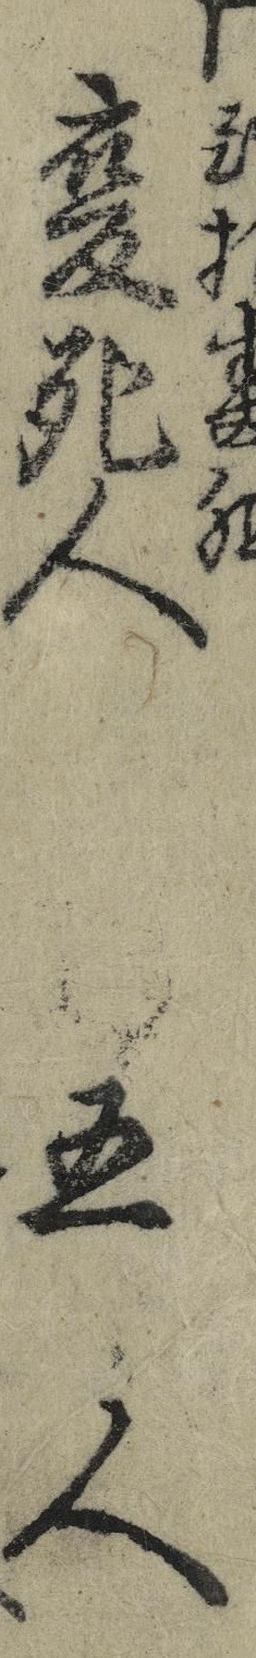変死人五人
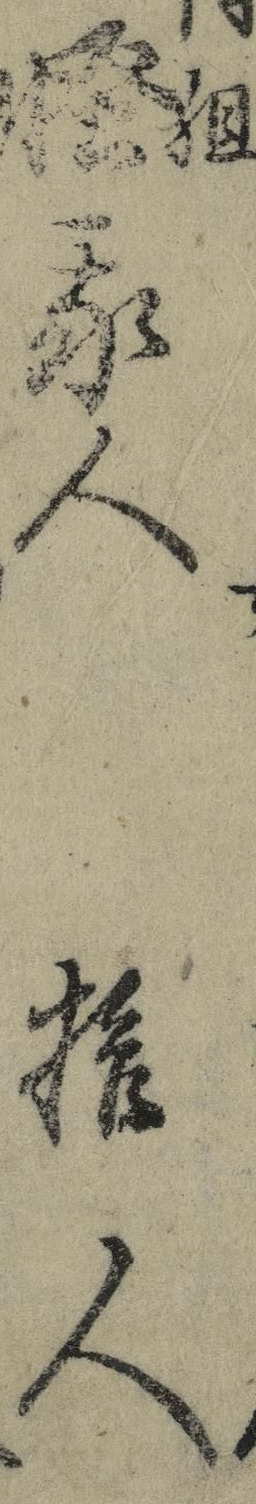怪我人拾人

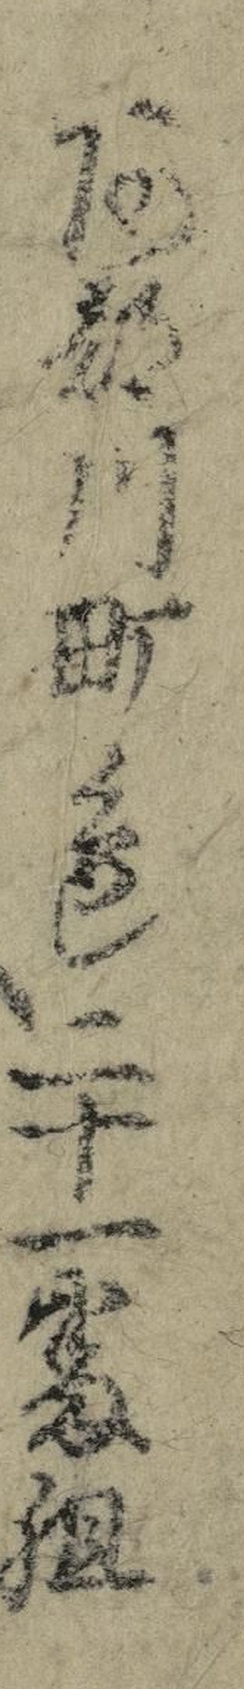阿部川町辺二十一番組
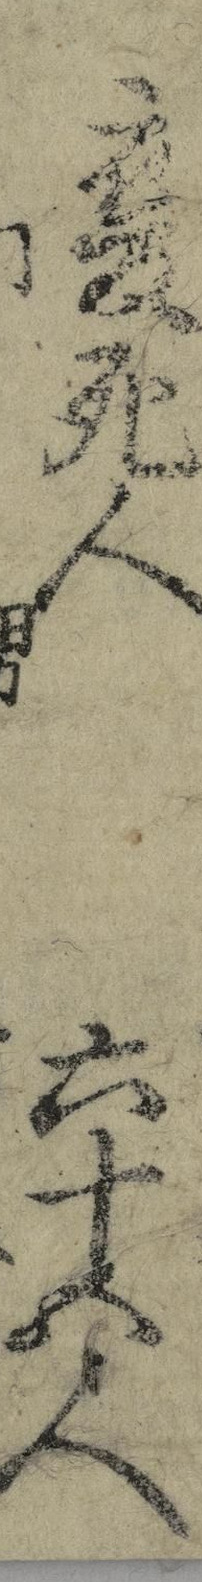変死人六十五人
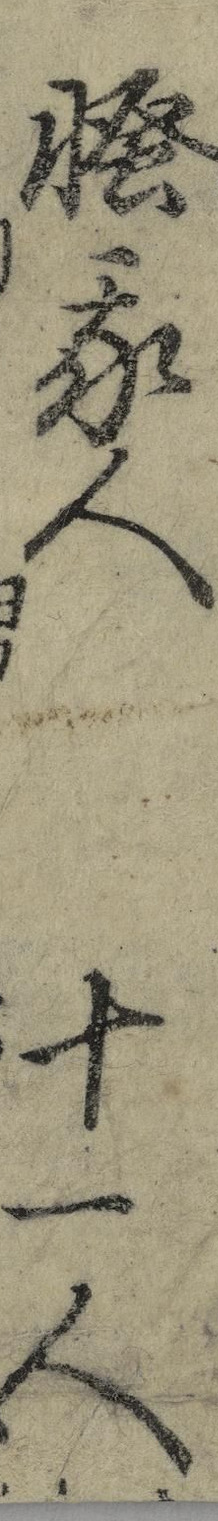怪我人十一人
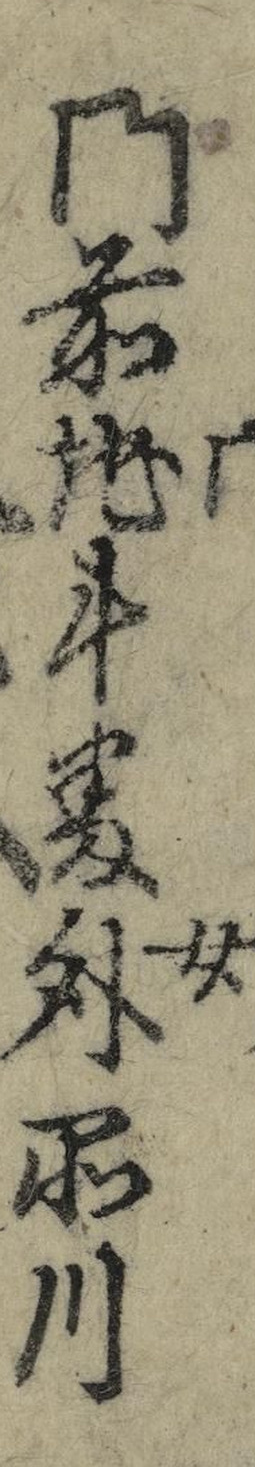門前地斗番外品川
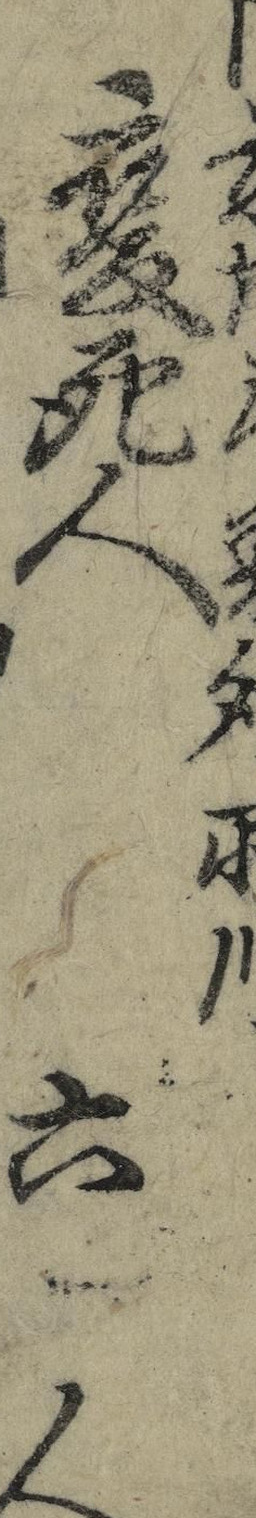変死人六人
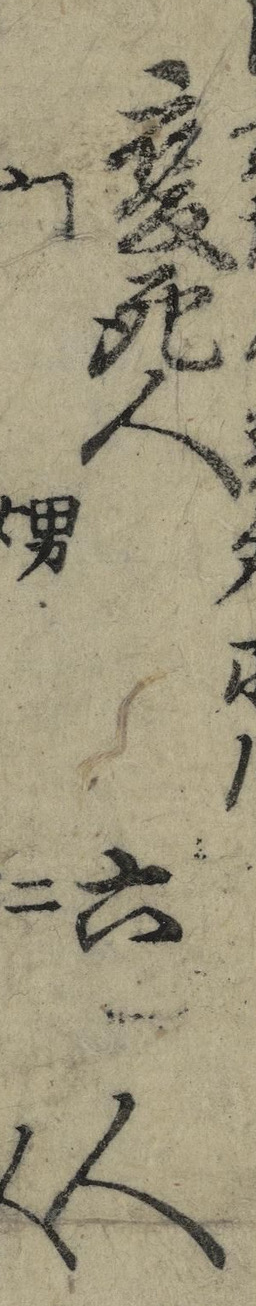変死人六人
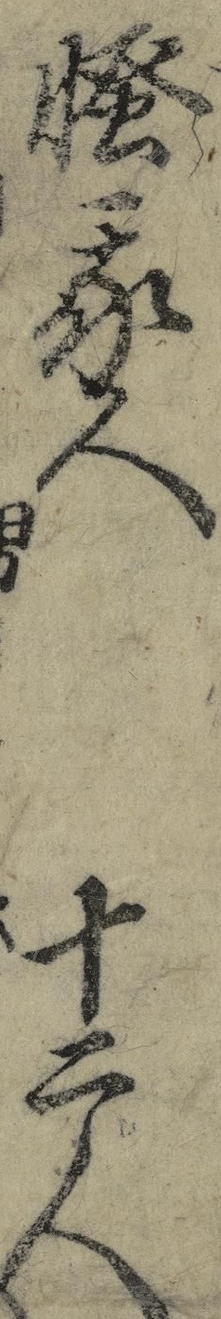怪我人十二人
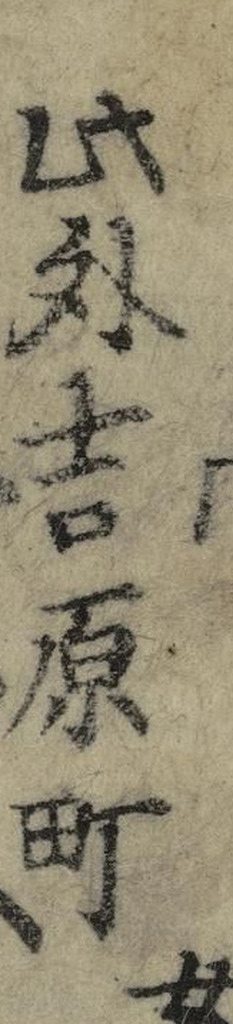此外吉原町
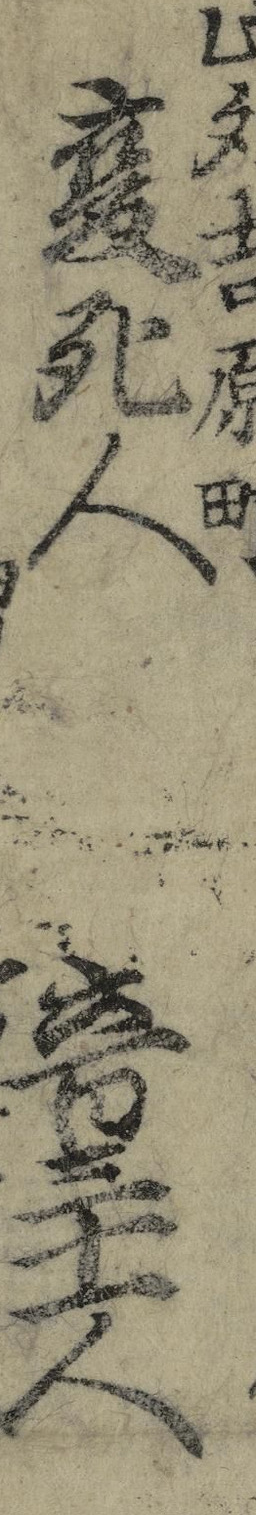変死人六百三十一人
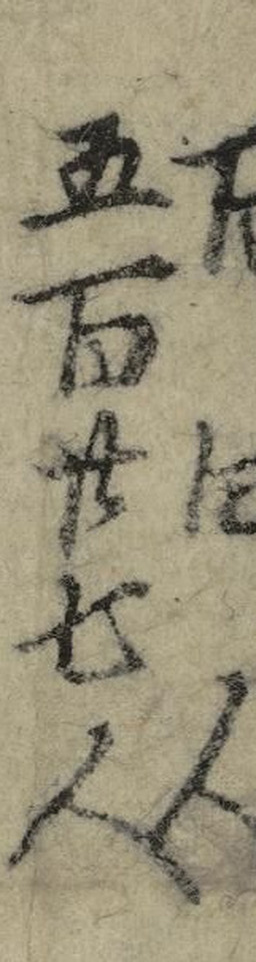女五百廿七人
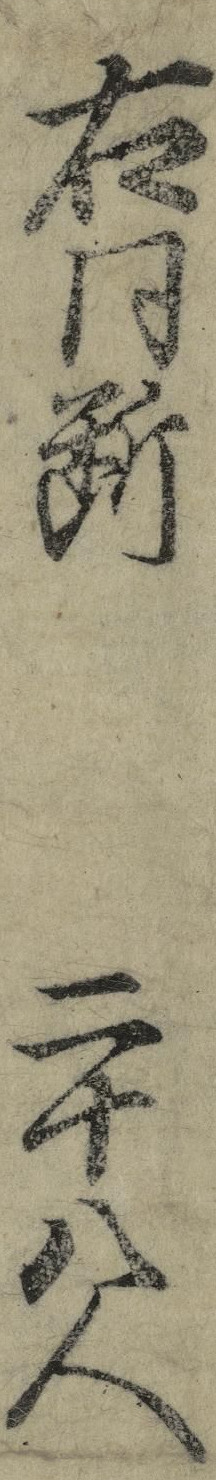右同断二十八人
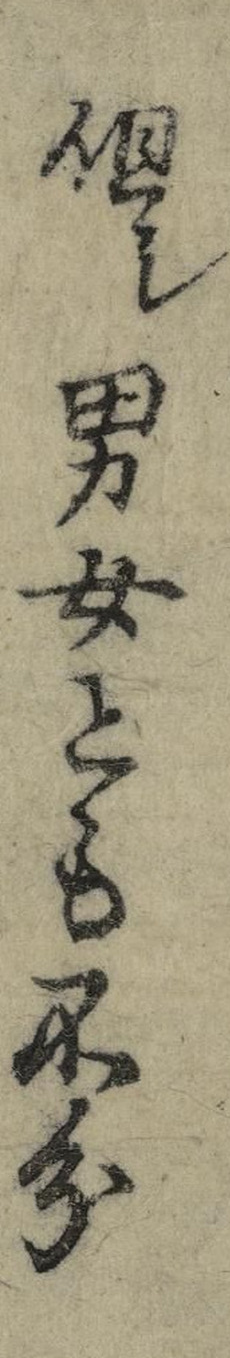但シ男女とも不分
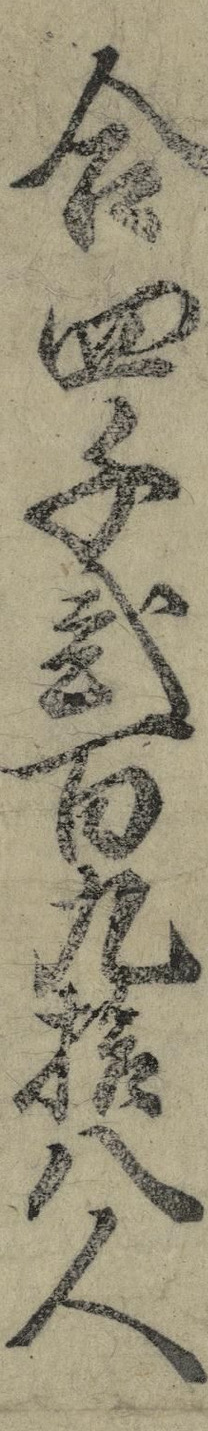合四千弐百九拾八人
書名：地震出火　男女死人怪我人書上之冩
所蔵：東京大学地震研究所図書室 Earthquake Research Institute Library, The University of Tokyo, JAPAN
